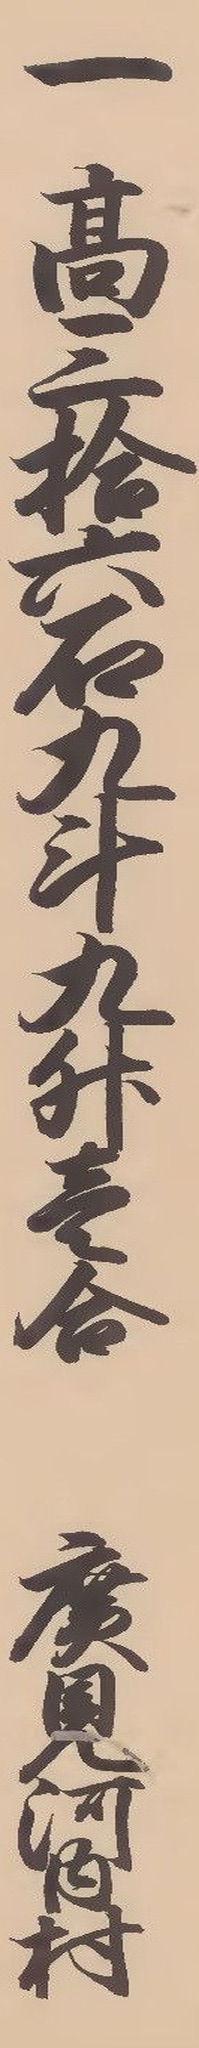一髙三拾六石九斗九升壱合廣見河内村
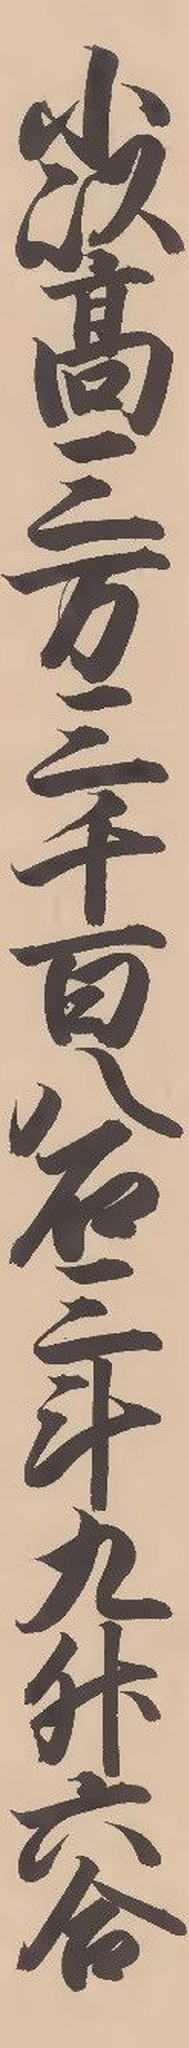小以髙三万三千百八石三斗九升六合
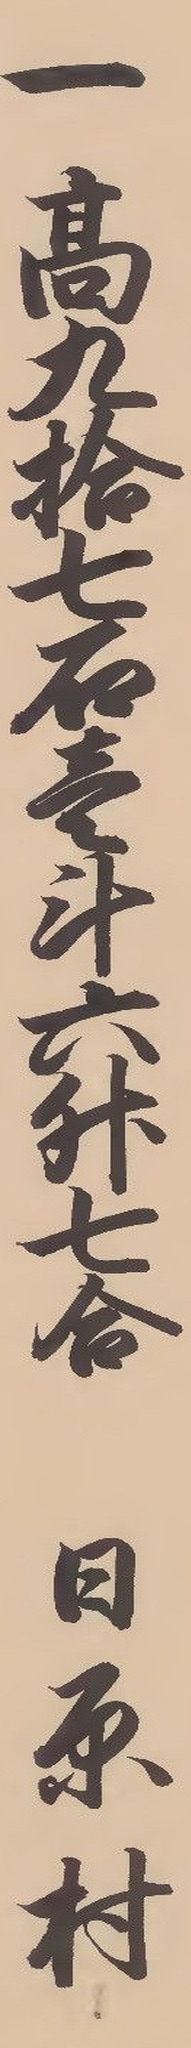一髙九拾七石壱斗六升七合日原村
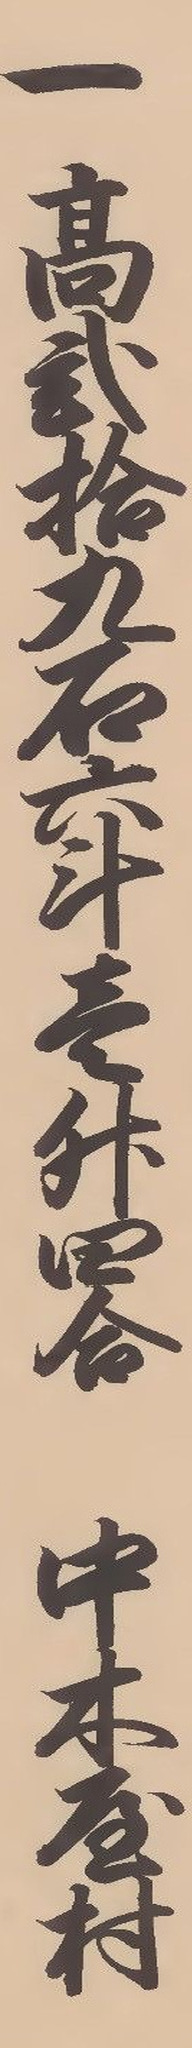一髙弐拾九石六斗壱升四合中木屋村
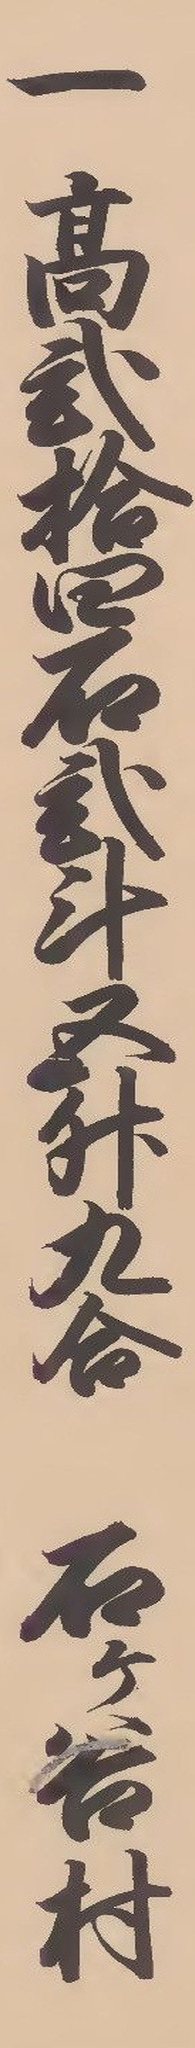一髙弐拾四石弐斗五升九合石ケ谷村

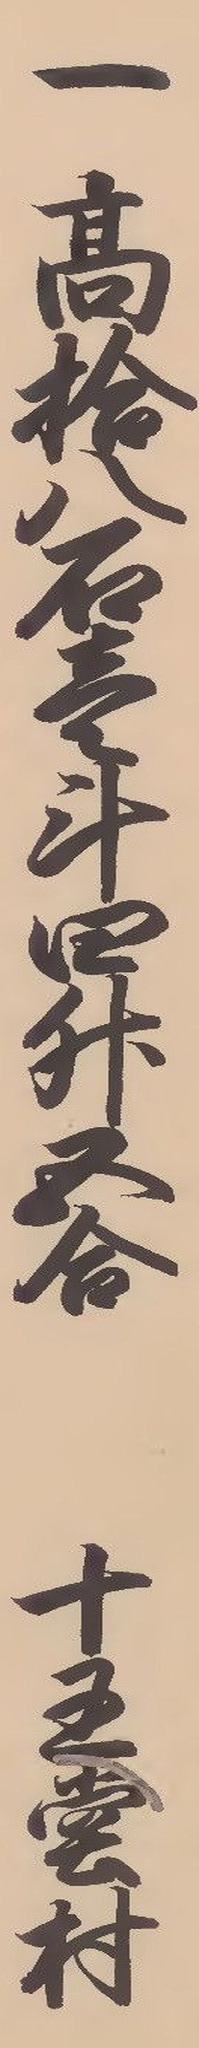一髙拾八石壱斗四升五合十王堂村
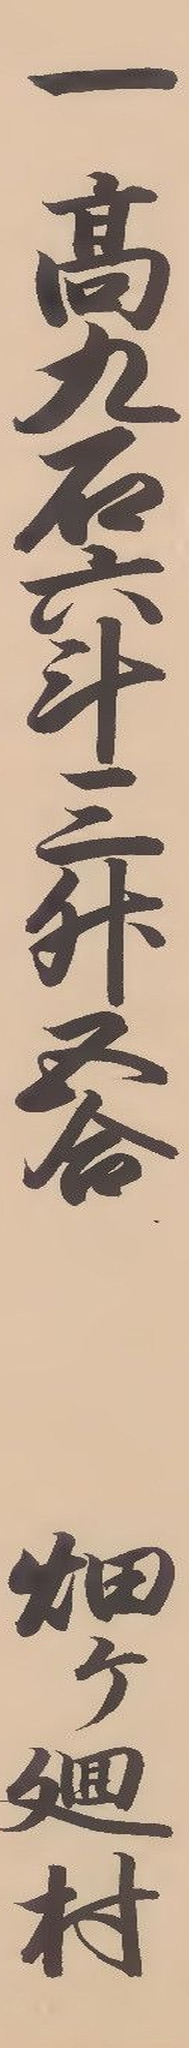一髙九石六斗三升五合畑ケ廻村
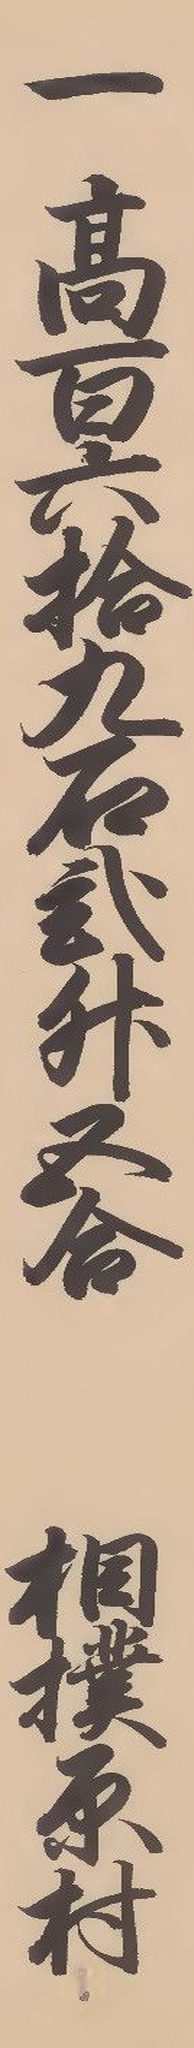一髙百六拾九石弐升五合相撲原村
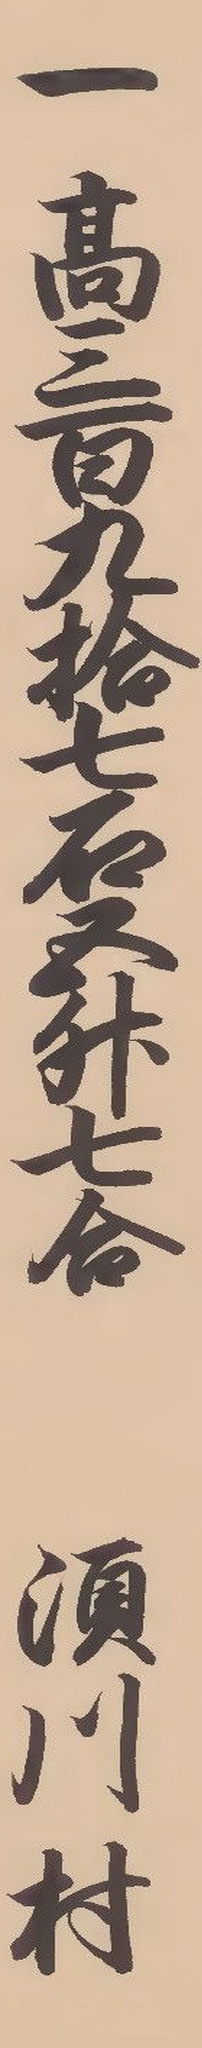一髙三百九拾七石五升七合須川村
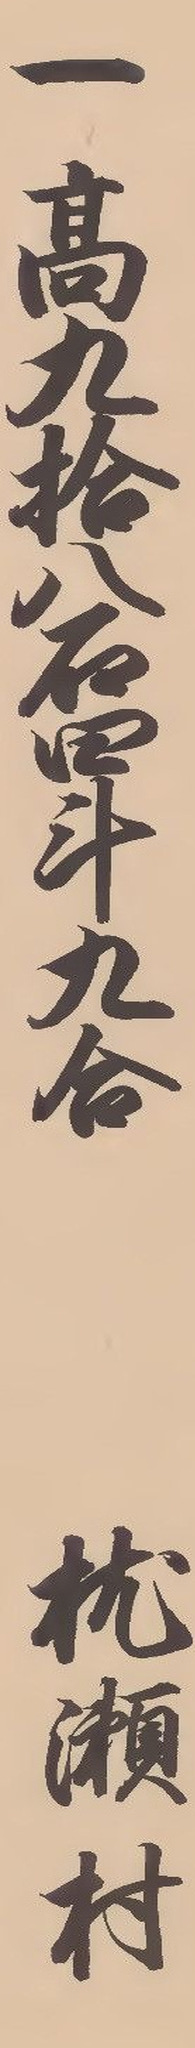一髙九拾八石四斗九合枕瀬村
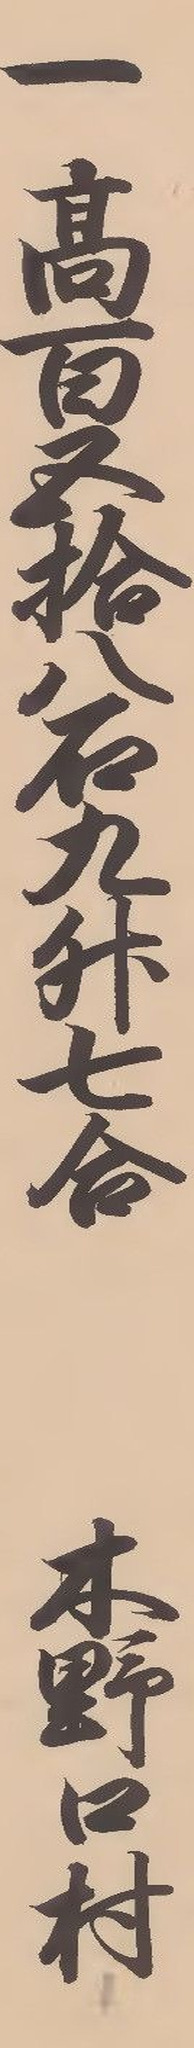一髙百五拾八石九升七合木野口村
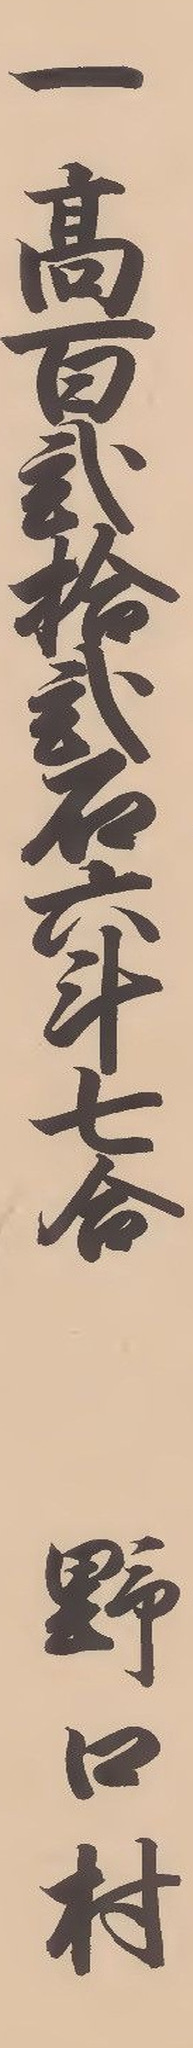一髙百弐拾弐石六斗七合野口村
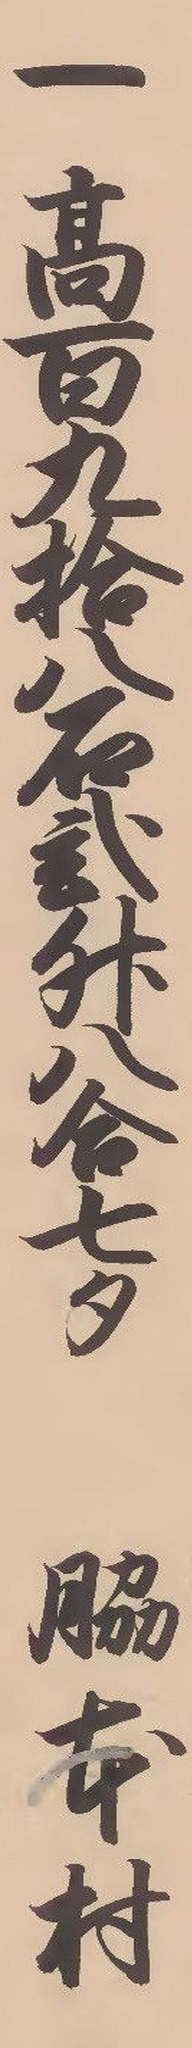一髙百九拾八石弐升八合七夕脇本村

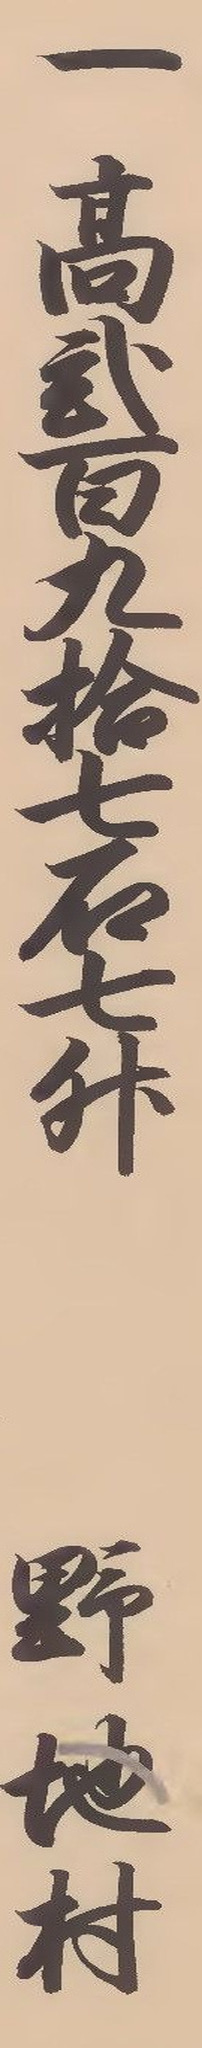一髙弐百九拾七石七升野地村
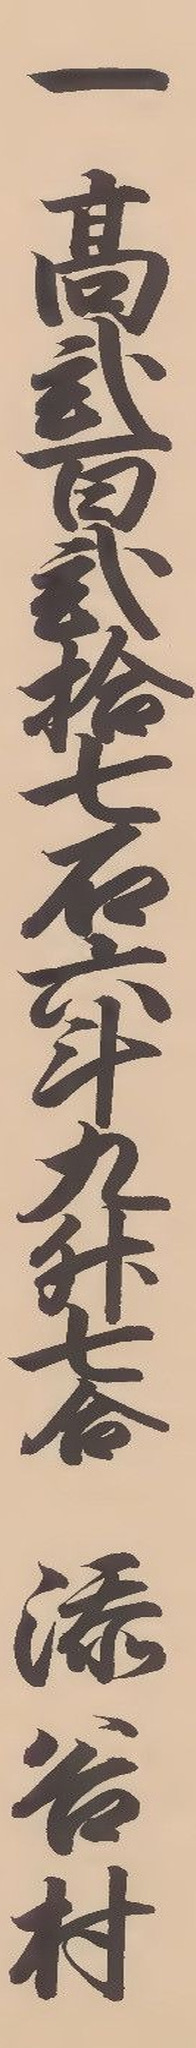一髙弐百弐拾七石六斗九升七合添谷村
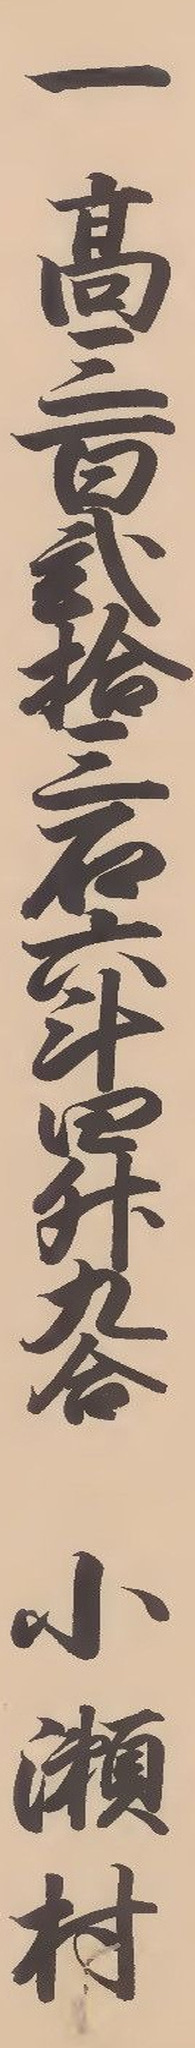一髙三百弐拾三石六斗四升九合小瀬村
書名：石見国郷帳
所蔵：国立公文書館 National Archives of Japan
